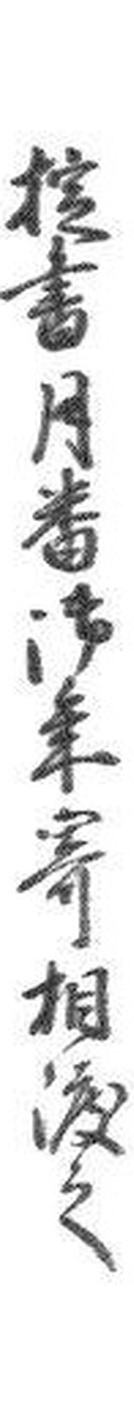掟書月番御年寄相渡之
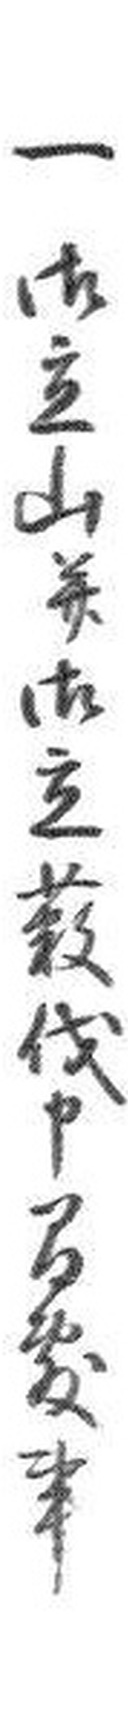一御立山并御立藪伐申間敷事
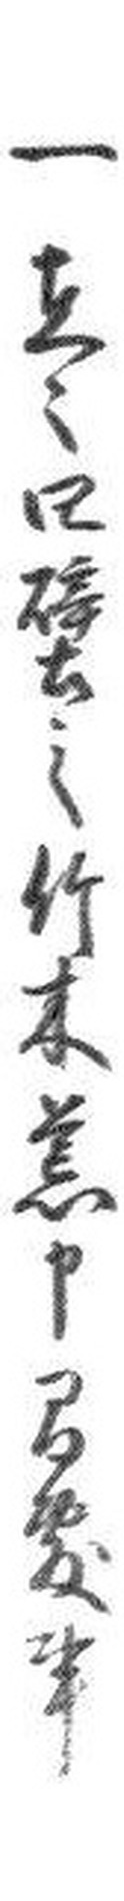一在々四壁之竹木荒申間敷事
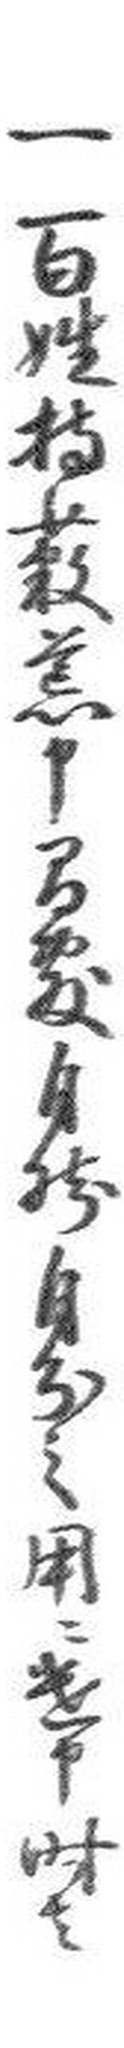一百姓持藪荒申間敷自然自分之用ニ遣申時者
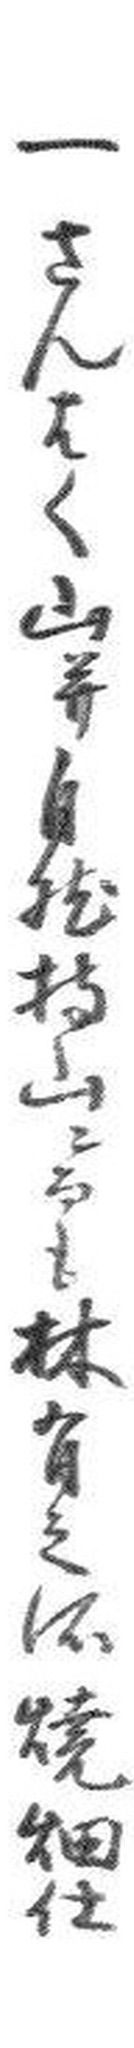一さんはく山并自然持山ニ而も林有之所焼畑仕
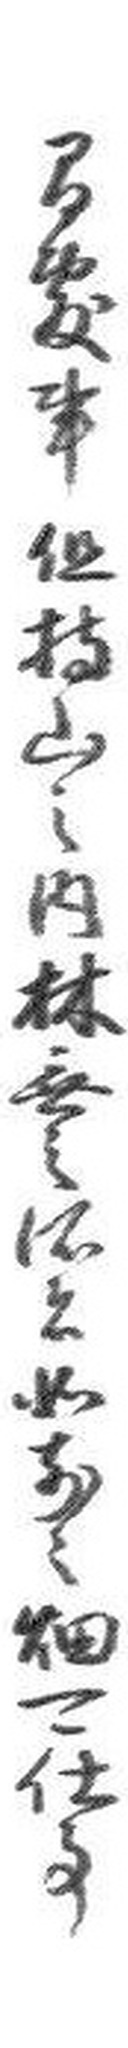間敷事但持山之内林無之所者如前々之畑可仕事
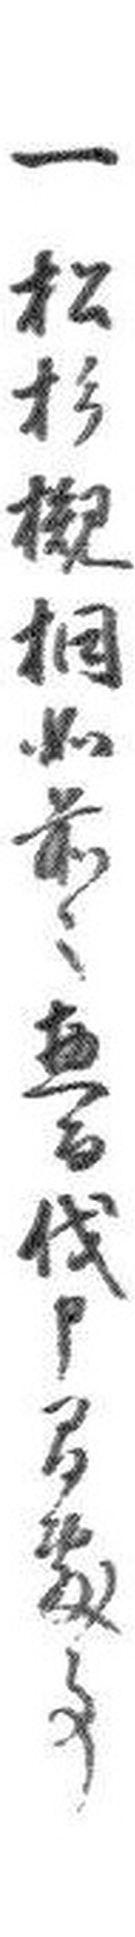一松杉槻桐如前々惣而伐申間敷事

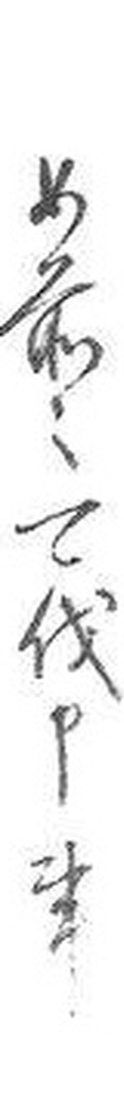如前々可伐申事
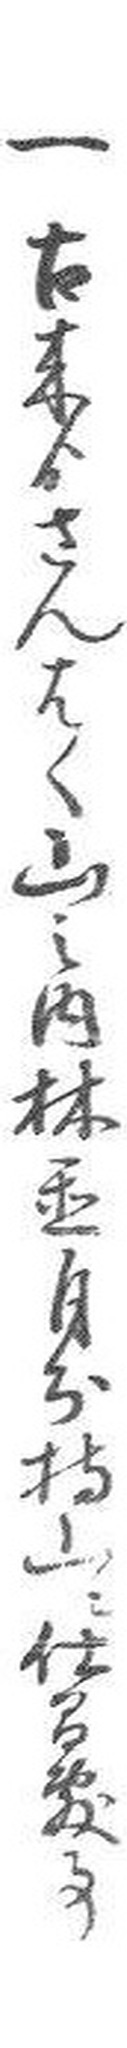一古来ゟさんはく山之内林置自分持山ニ仕間敷事
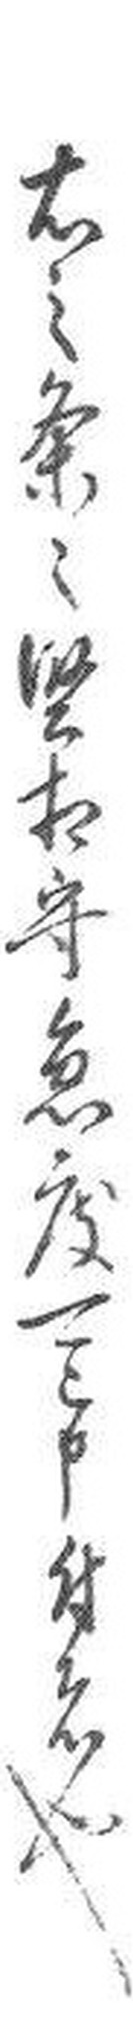右之条々堅相守急度可被申付者也
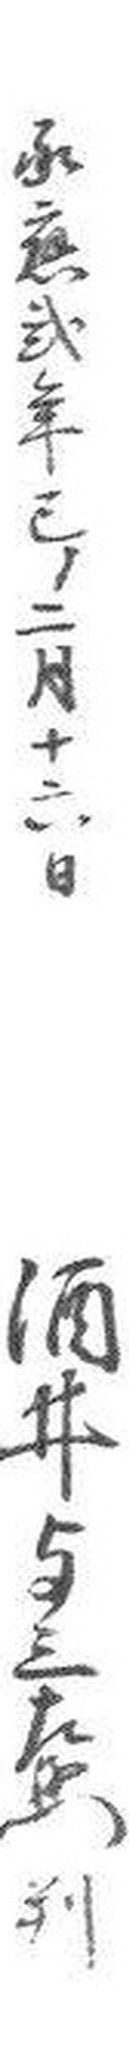承応弐年巳ノ二月十六日酒井与三左衛門判
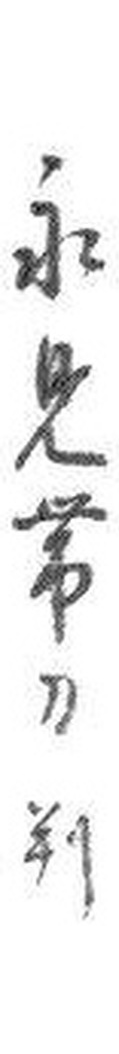永見帯刀判
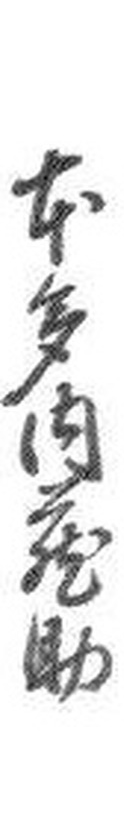本多内蔵助
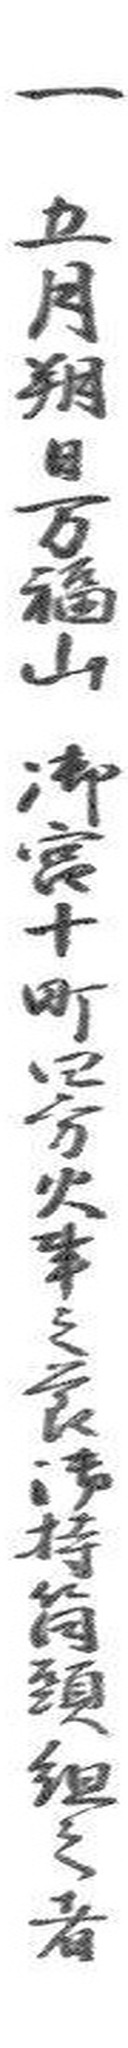一五月朔日万福山御宮十町四方火事之節御持筒頭組之者
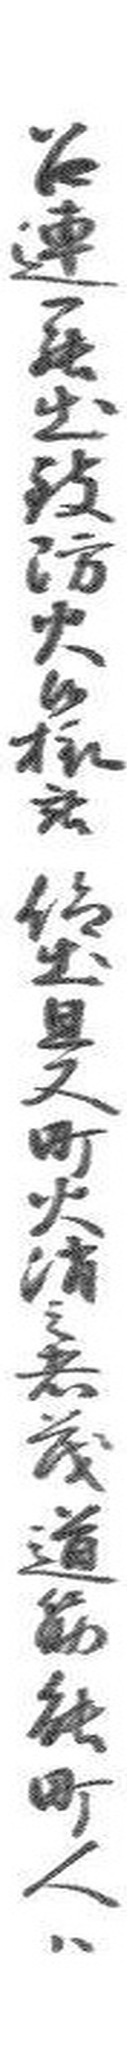召連罷出致防火候様被仰出且又町火消之者茂道筋能町人ハ
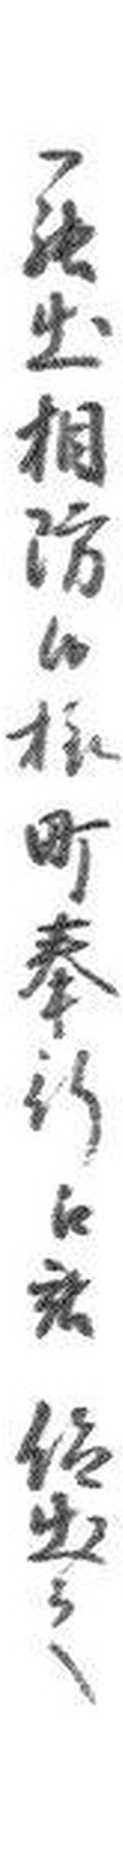罷出相防候様町奉行江被仰出之
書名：家譜 五 光通公 従寛永十三年到万治二年
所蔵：福井県文書館 Fukui Prefectural Archives
